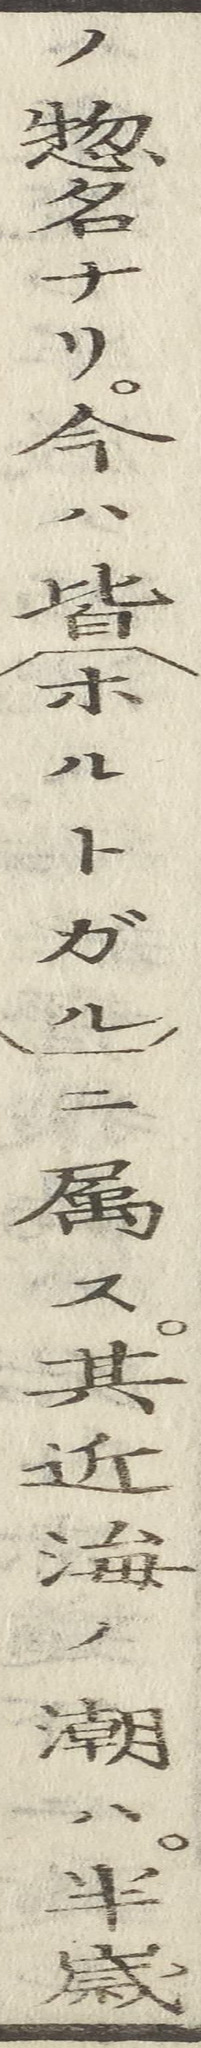ノ惣名ナリ。今ハ皆〔ホルトガル〕ニ属ス。其近海ノ潮ハ。半歳

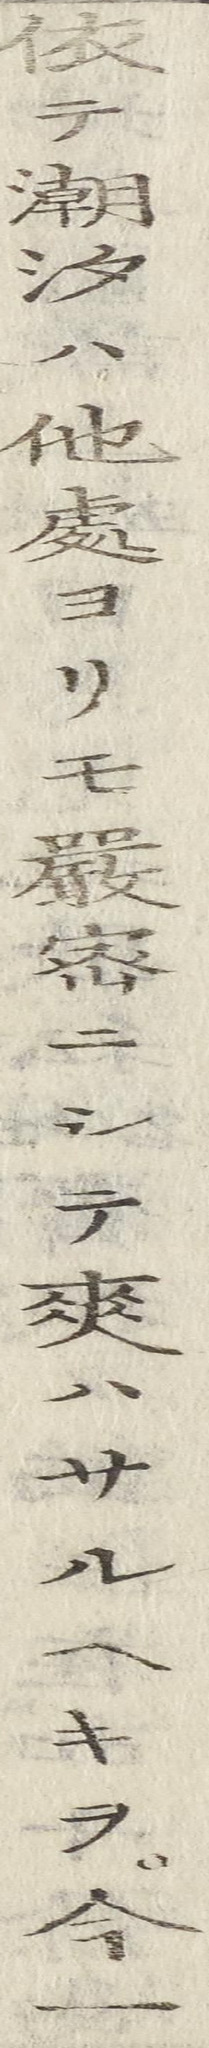依テ潮汐ハ他処ヨリモ厳密ニシテ爽ハサルヘキヲ。今一
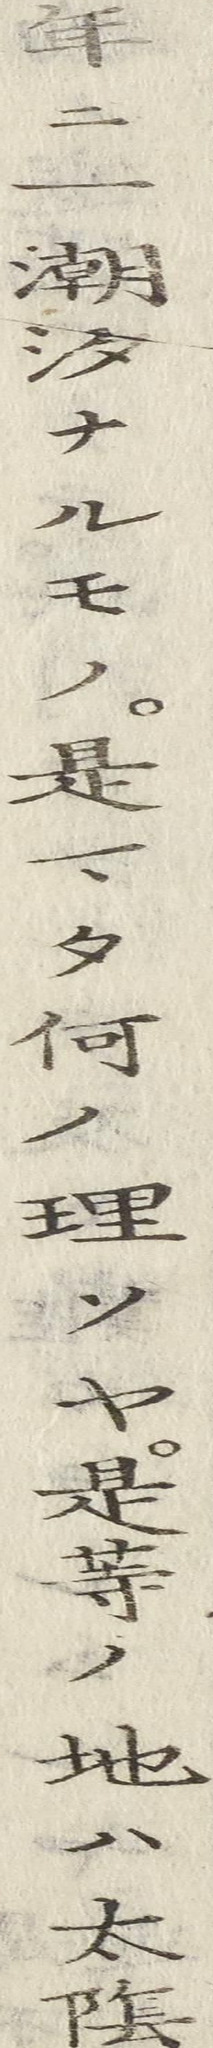年ニ一潮汐ナルモノ。是マタ何ノ理ソヤ。是等ノ地ハ太陰
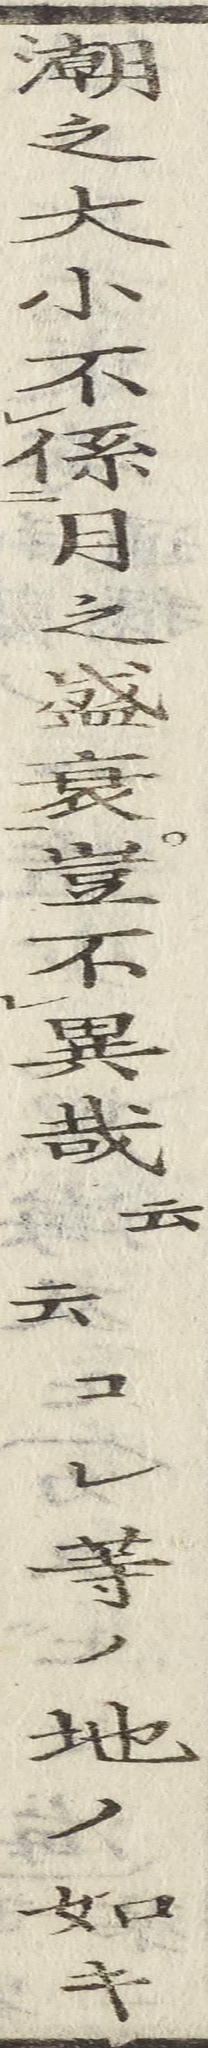潮之大小不係ニ月之盛衰。豈不異哉云云コレ等ノ地ノ如キ
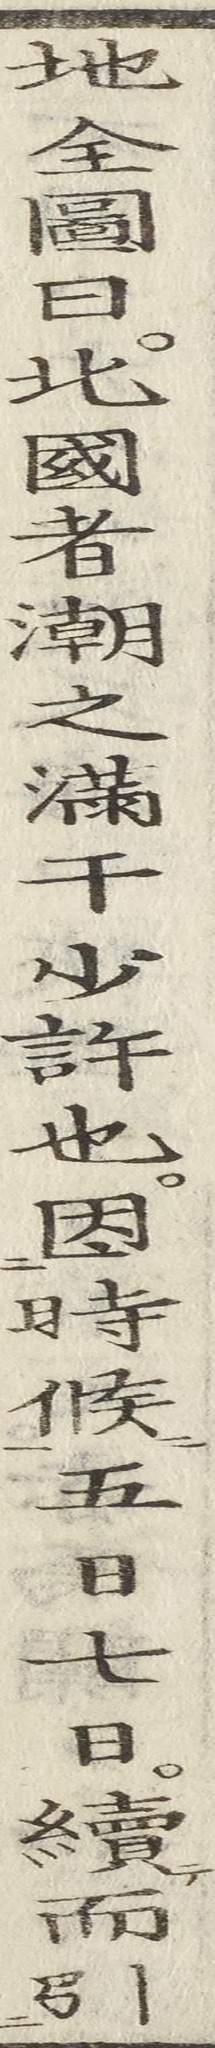地全図曰。北国者潮之満干少許也。因ニ時候五日七日。続而引ニ
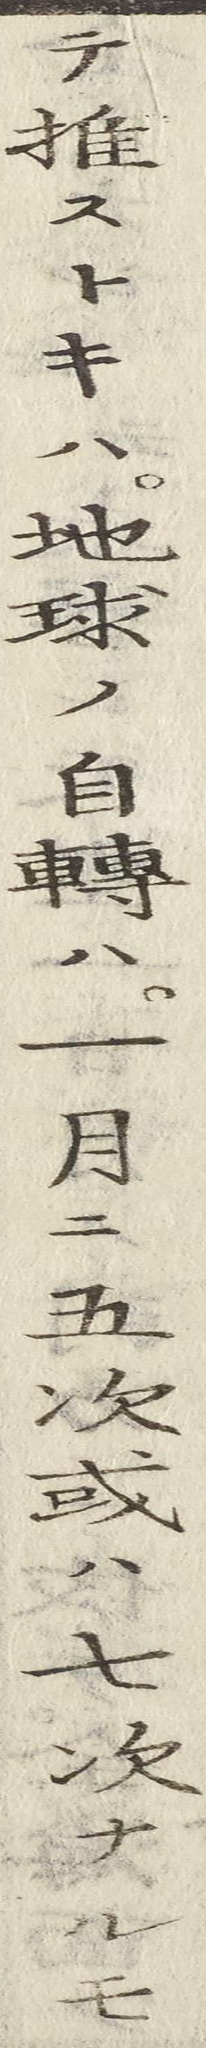テ推ストキハ。地球ノ自転ハ。一月ニ五次或ハ七次ナルモ
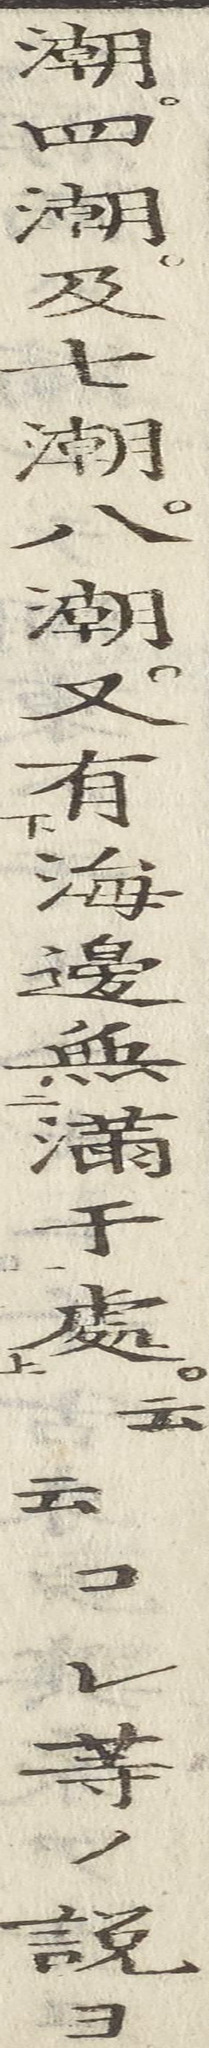潮。四潮。及七潮。八潮。又有海辺無ニ満干処。云云コレ等ノ説ヨ
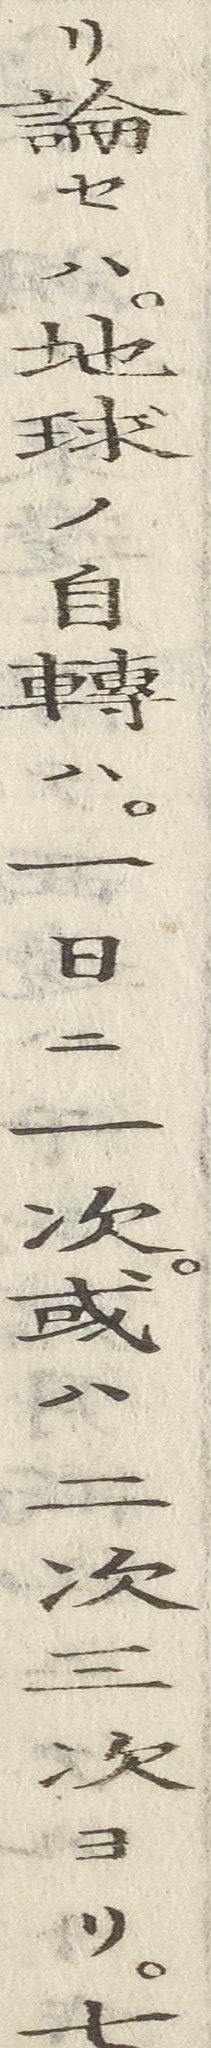リ論セハ。地球ノ自転ハ。一日ニ一次。或ハ二次三次ヨリ。七
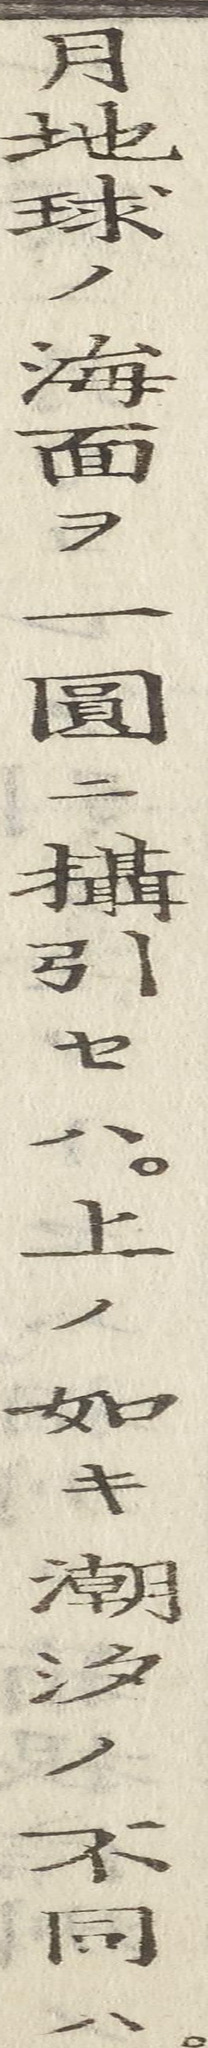月地球ノ海面ヲ一円ニ摂引セハ。上ノ如キ潮汐ノ不同ハ。
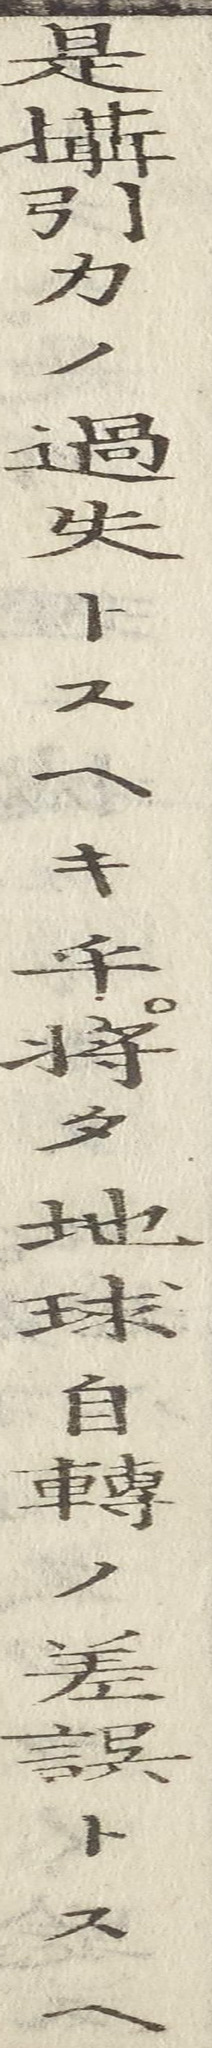是摂引力ノ過失トスヘキ乎。将タ地球自転ノ差誤トスヘ
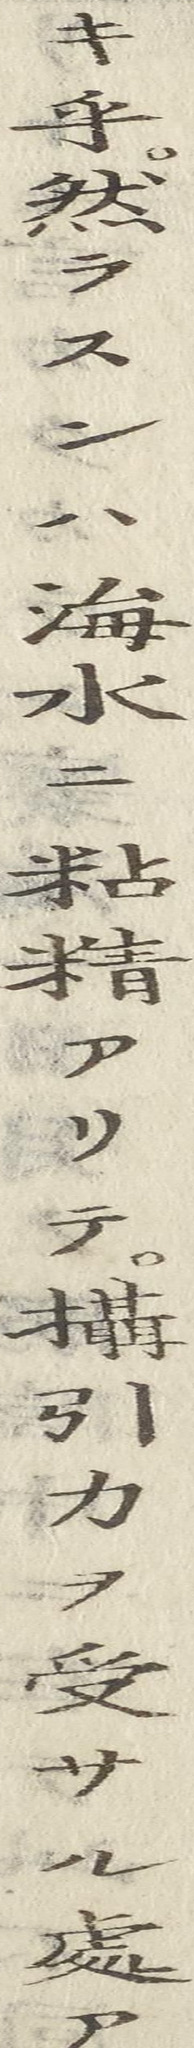キ乎。然ラスンハ海水ニ粘精アリテ。摂引力ヲ受サル処ア

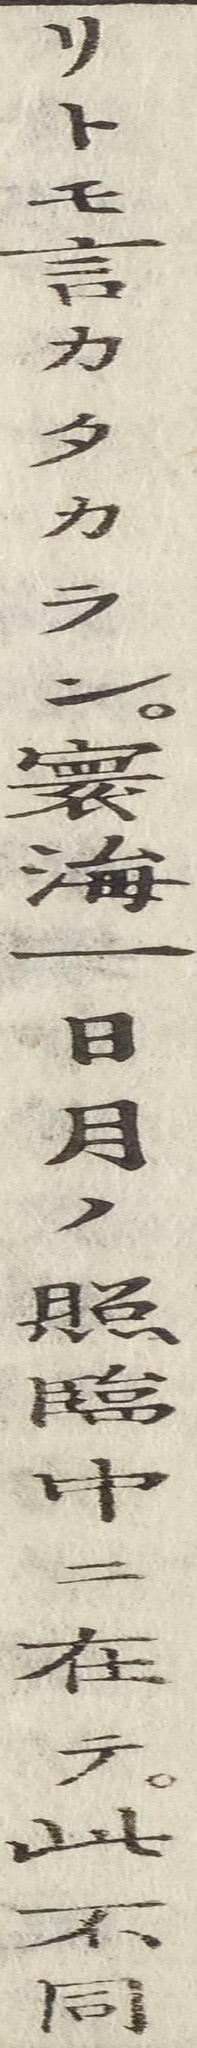リトモ言カタカラン。寰海一日月ノ照臨中ニ在テ。此不同
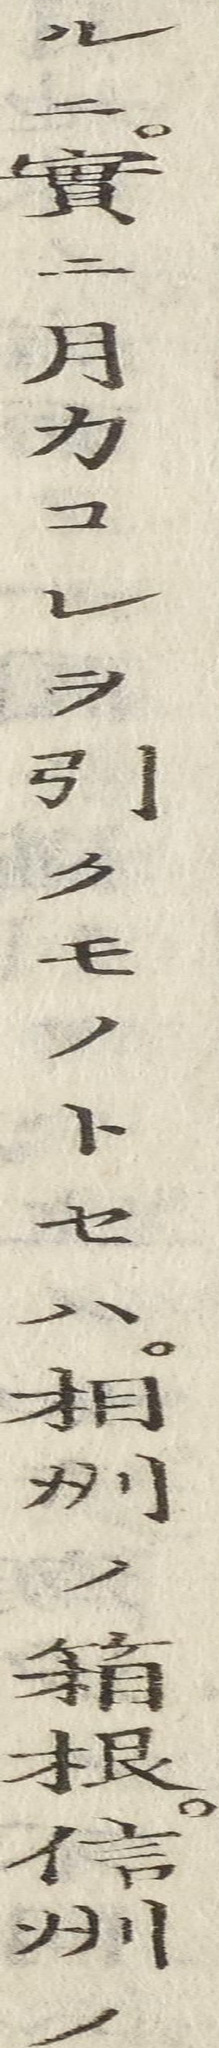ルニ。実ニ月力コレヲ引クモノトセハ。相州ノ箱根。信州ノ
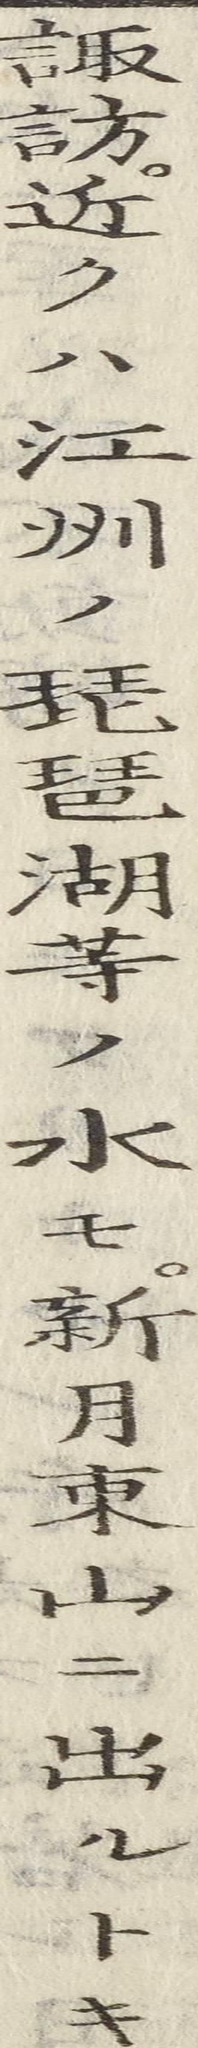諏訪。近クハ江州ノ琵琶湖等ノ水モ。新月東山ニ出ルトキ
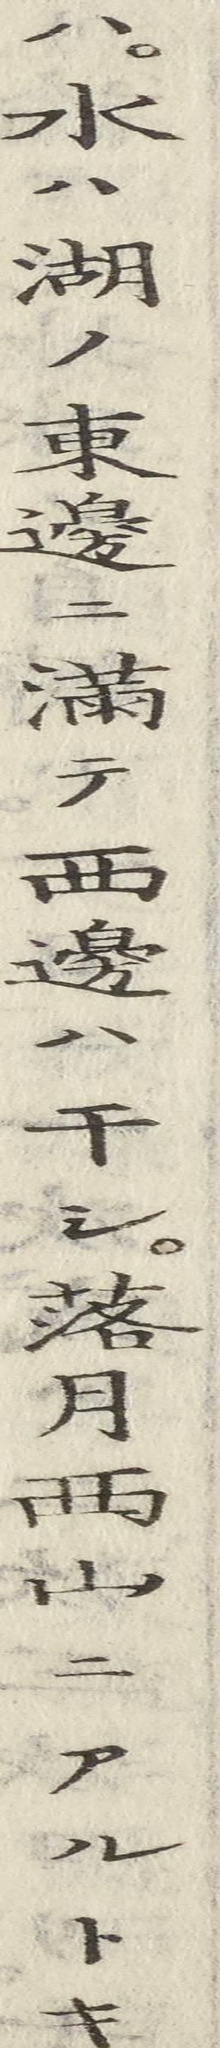ハ。水ハ湖ノ東辺ニ満テ西辺ハ干シ。落月西山ニアルトキ
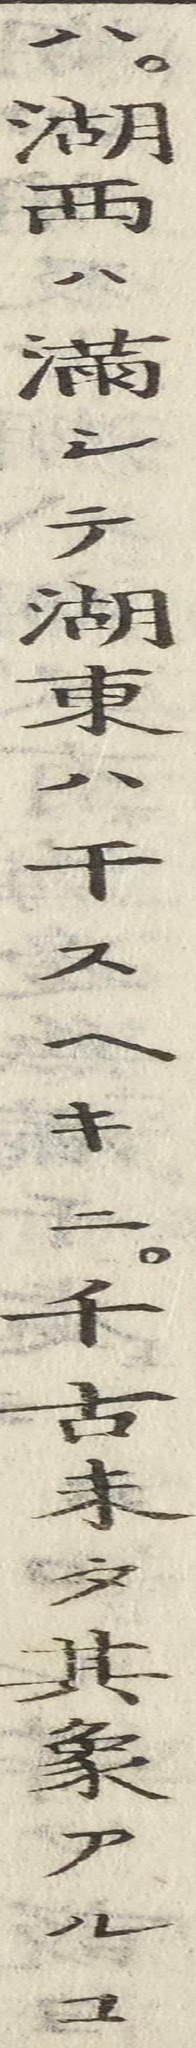ハ。湖西ハ満シテ湖東ハ干スヘキニ。千古未タ其象アルコ
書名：護法新論　二編　下
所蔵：東京大学地震研究所図書室 Earthquake Research Institute Library, The University of Tokyo, JAPAN
